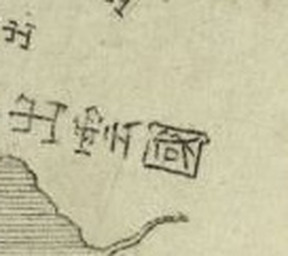出雲國

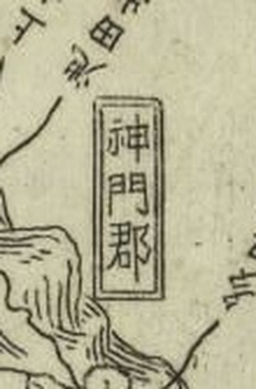神門郡
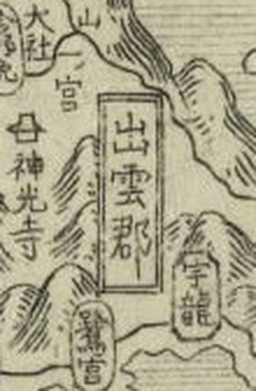出雲郡
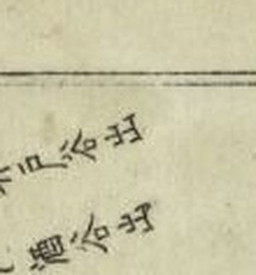井戸谷出
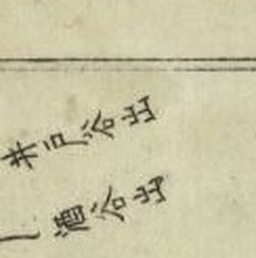井戸谷出
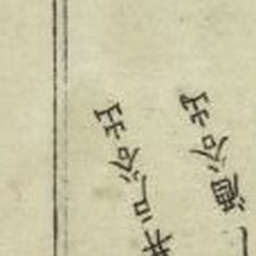井戸谷出
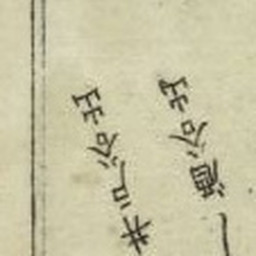井戸谷出
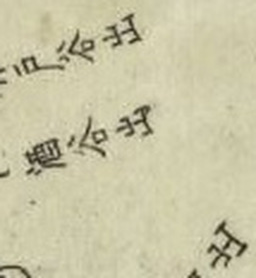酒谷出
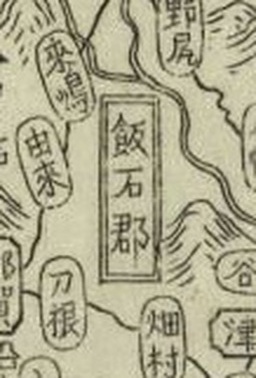飯石郡
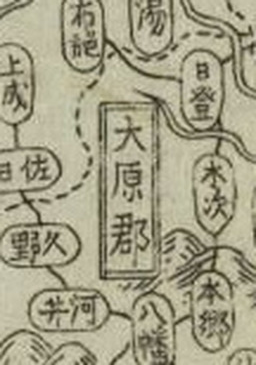大原郡
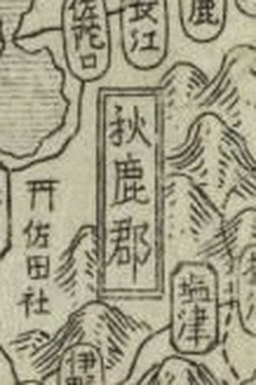秋鹿郡
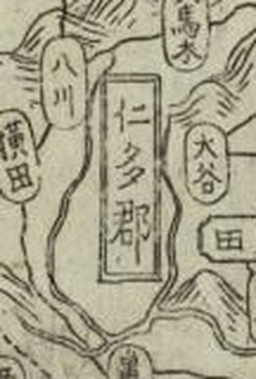仁多郡

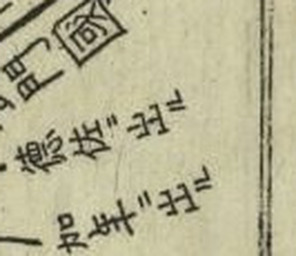徳佐に出る
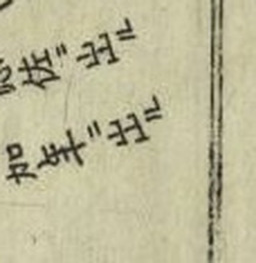加年に出る
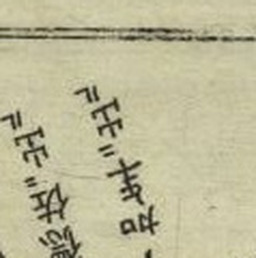加年に出る
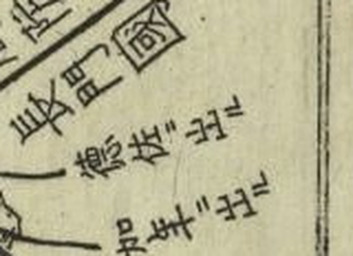徳佐に出る
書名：大日本国細図 西国之部 下
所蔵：University of the Ryukyus Library
